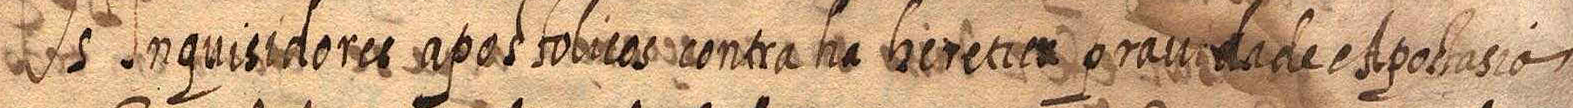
Os Inquisidores apostolicos contra ha heretica prauidade e Apostasia
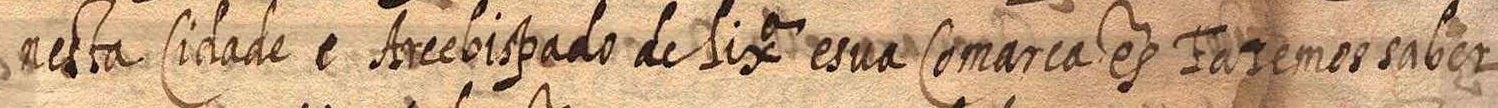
nesta Cidade e Arcebispado de lixa e sua Comarca ēꝭ Fazemos saber
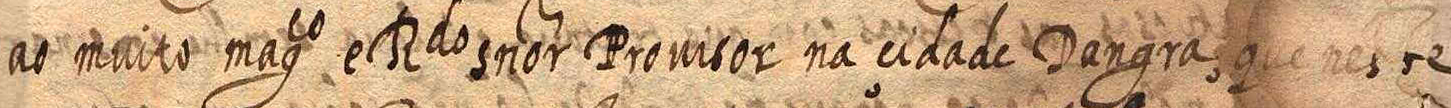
ao muito magco e Rdo snōr Prouisor na cidade Dangra, que neste
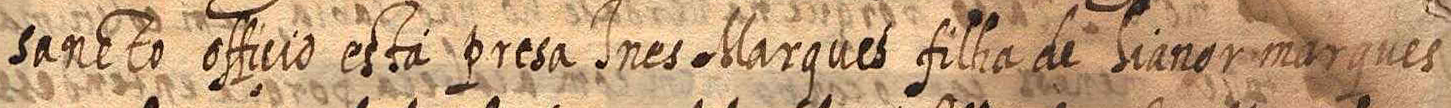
sancto officio esta presa Ines Marques filha de Lianor marques
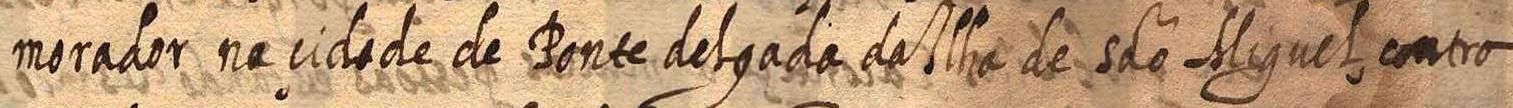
morador na cidade de Ponte delgada da Ilha de são Miguel, contra
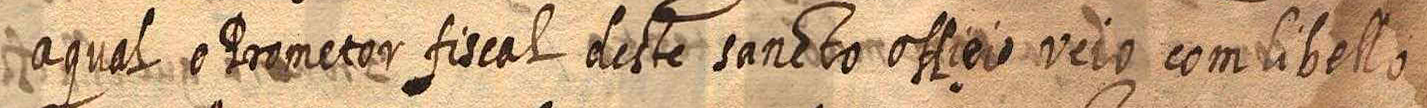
a qual o Prometor fiscaL deste sancto officio veio com libello
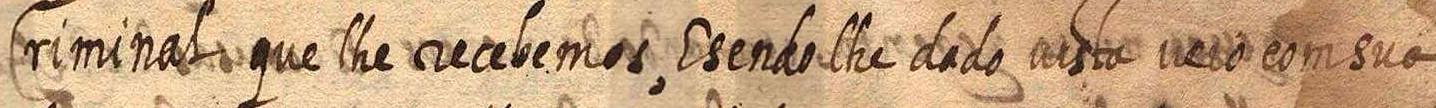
Criminal que lhe recebemos, E sendo lhe dado uista ueio com sua
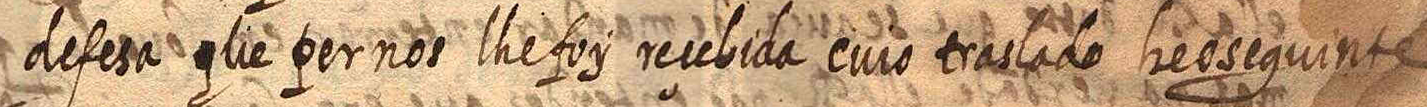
defesa que per nos lhe foy recebida cuio traslado he o seguinte
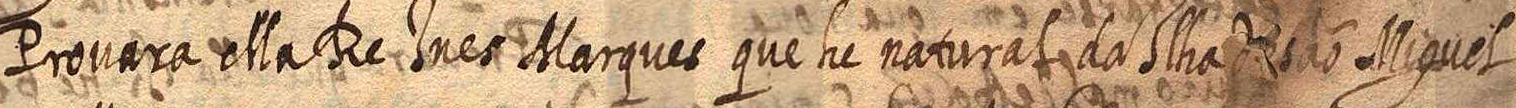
Prouara ella Re Ines Marques que he naturaL da Ilha de são MigueL
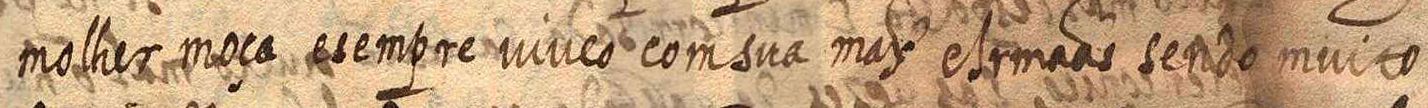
molher moça e sempre uiueo com sua may e Irmāas sendo muito
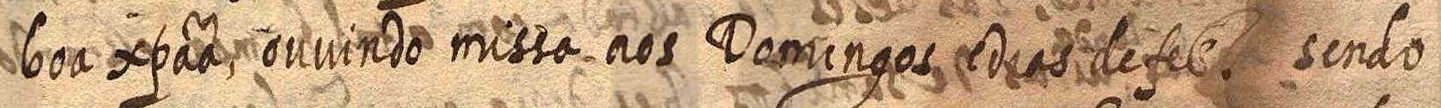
boa xpaā, ouuindo missa aos Domingos e dias de fee. sendo
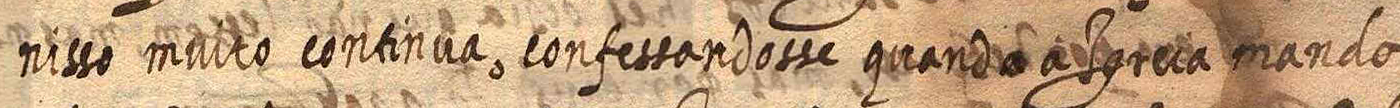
nisso muito continua confessandosse quando a Igreia manda
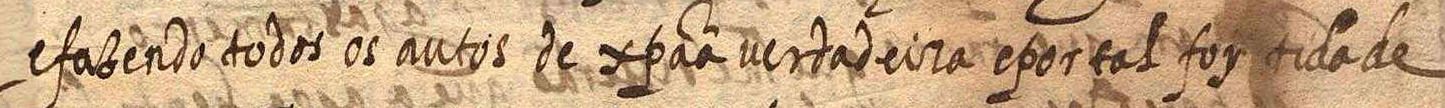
e fazendo todos os autos de xpaā uerdadeira e por tal foy tida de
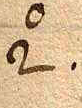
2º.
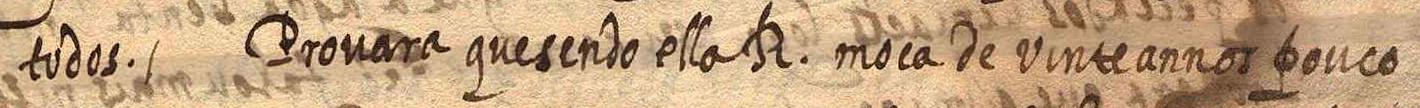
todos ./ Prouara que sendo ella R. moça de vinte annos pouco
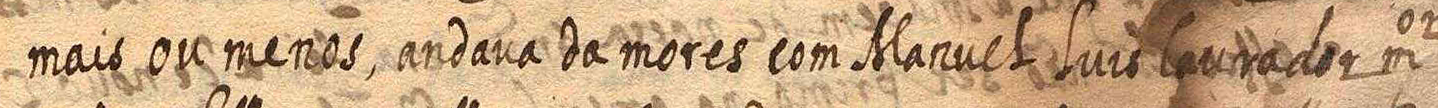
mais ou menos, andaua damores com Manuel luis laurador mor
